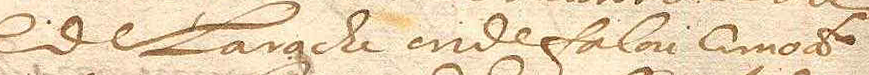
e de Larache onde falou com o d̄o
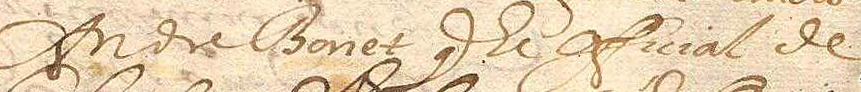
Andre Bonet q̄ he official de
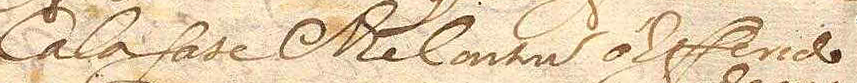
Calafate e lhe Contou o Referido
